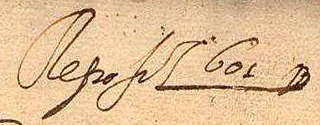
Repo foL 601
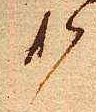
15
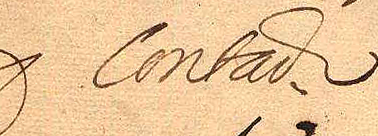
Contado
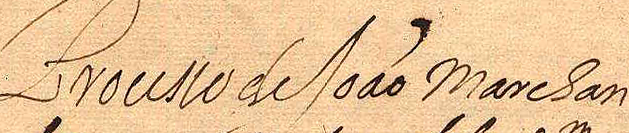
Processo de João Marchan
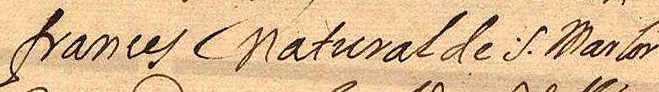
frances, natural de S. Marlor
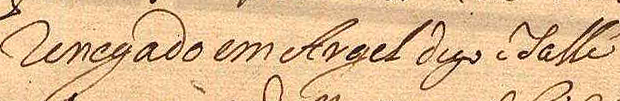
renegado em Argel, digo ē Sallé
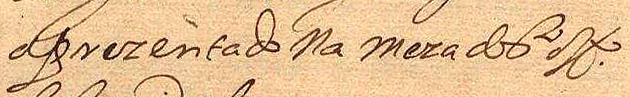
aprezentado na meza do sto off.o
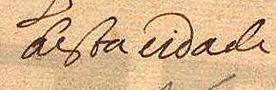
desta cidade
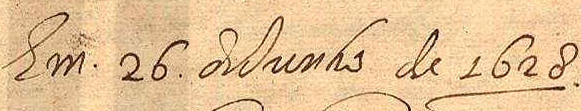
Em 26. de Iunho de 1628
